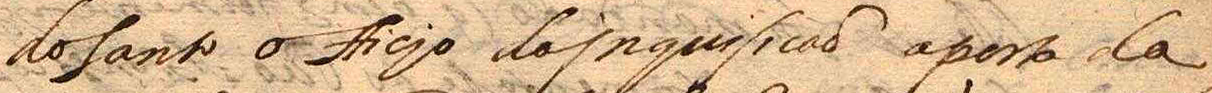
do Santo officio da jnquisição a porta da
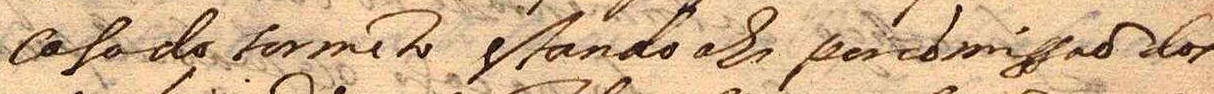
casa do tormēto estando ahi per cōmissaõ dos
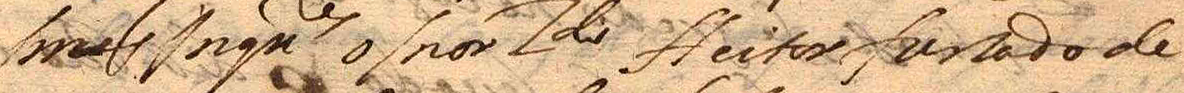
Snres Jnqures o Snor Ldo Heitor furtado de
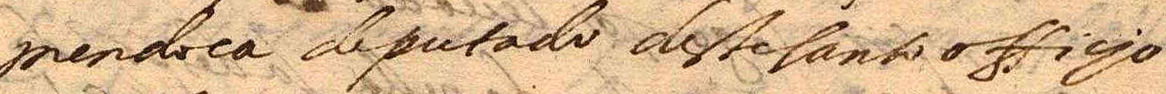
mendoca deputado deste santo officjo
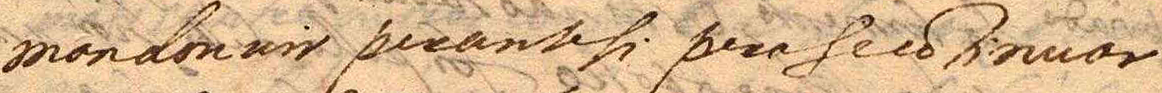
mandou uir perante si pera se cōtinuar
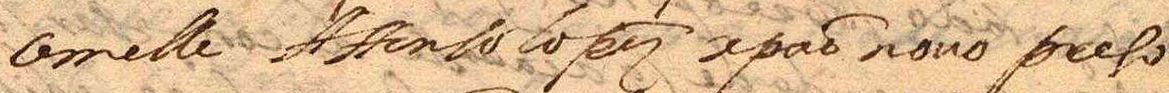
com elle Affonso lopēz xpaõ nouo preso
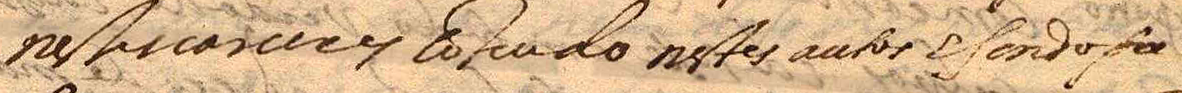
nestes carceres cōteudo nestes autos E sendo pre
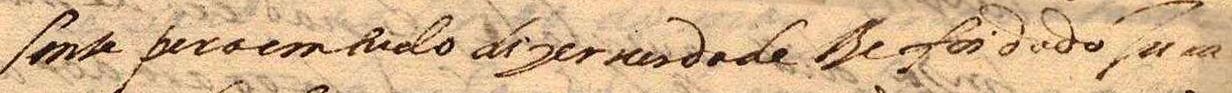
sente pera em tudo dizer uerdade lhe foi dado Jura
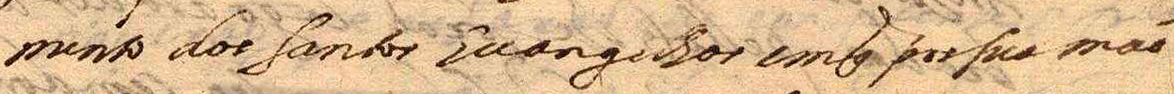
mento dos Santos Euangelhos em q̄ pos sua maõ
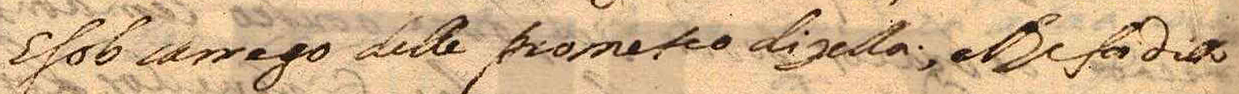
E sob carrego delle prometeo dizella; e lhe foi ditto
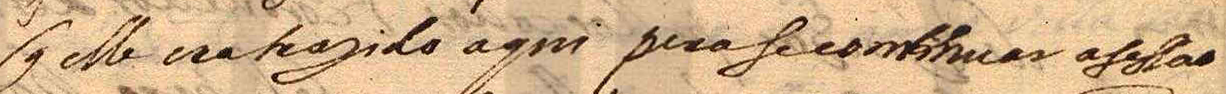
q̄ elle era trazido aqui pera se continuar a sessaõ
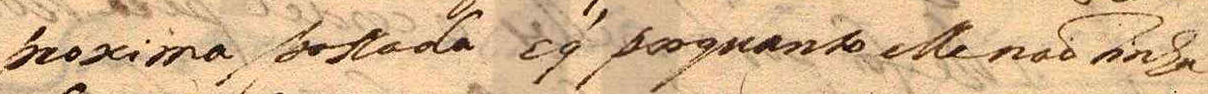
proxima passada E q̄ porquanto elle nõ tinha
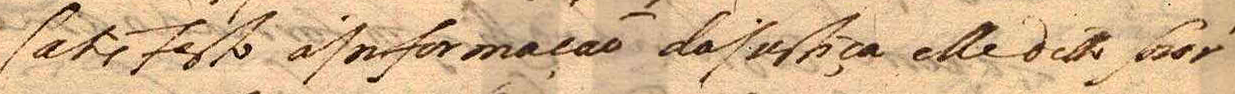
Satisfecto a Jnformação da Justiça elle ditto Snor̄
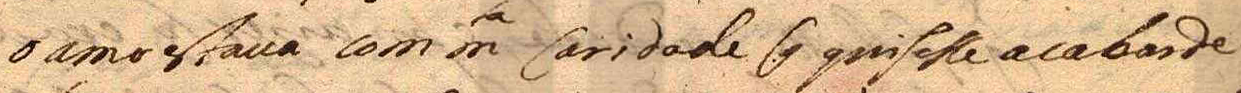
o amoestaua com mta Caridade q̄ quisesse acabar de
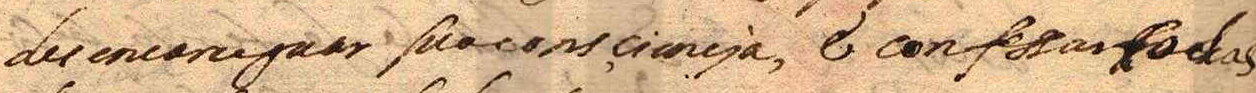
desencarreguar sua consçiencja, E confessar todas
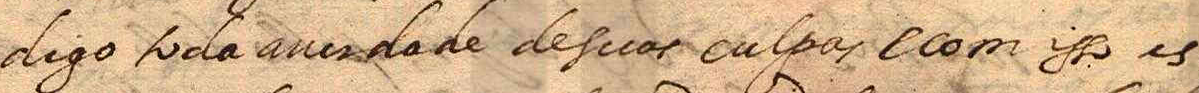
digo toda a uerdade de suas culpas e com isso es
